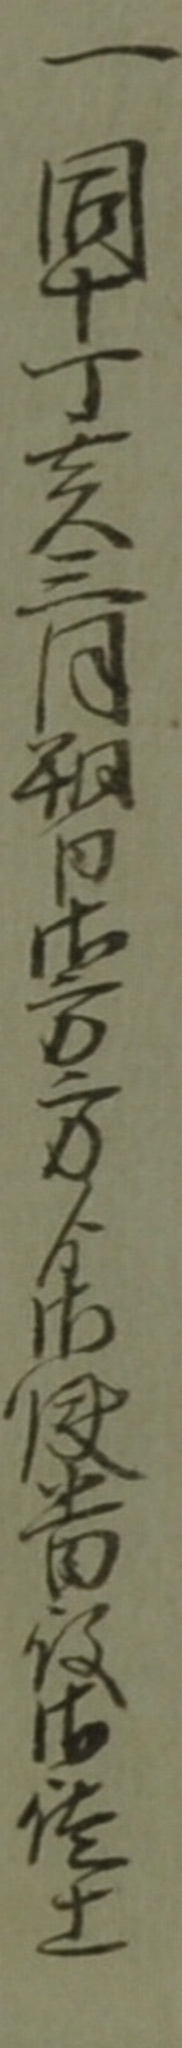一同十丁亥三月朔日御方方ゟ御使番役御徒士
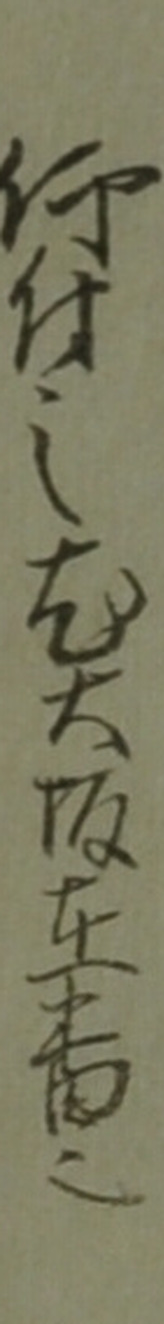仰付之尤大阪在番也
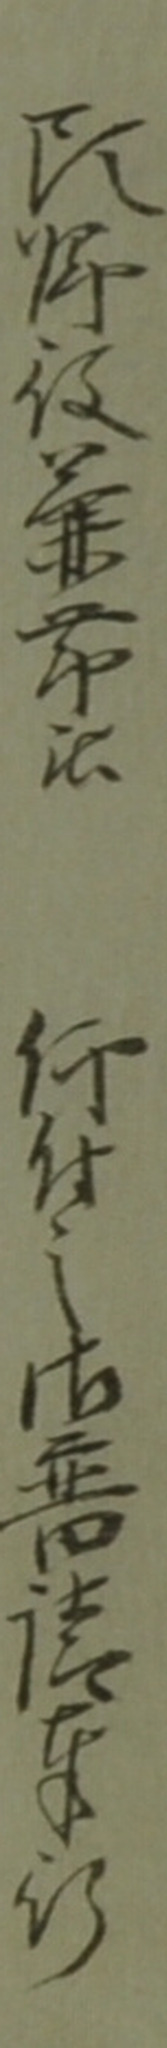頭帰役兼帯被仰付之御普請奉行
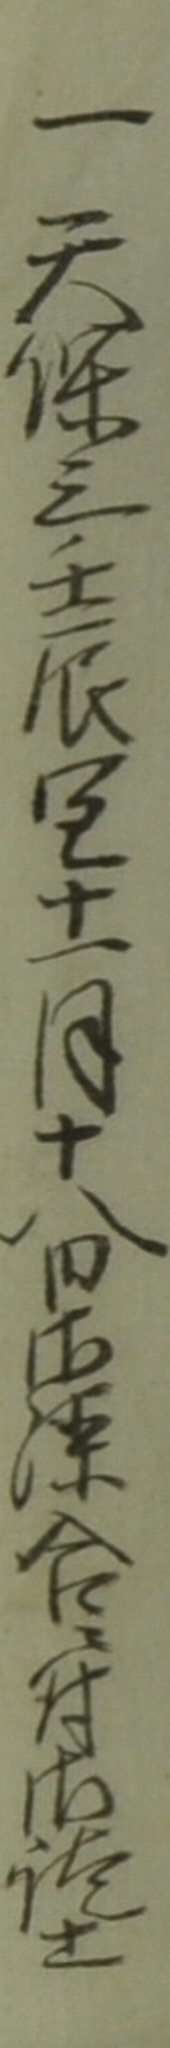一天保三壬辰閏十一月十八日御繰合ニ付御徒士
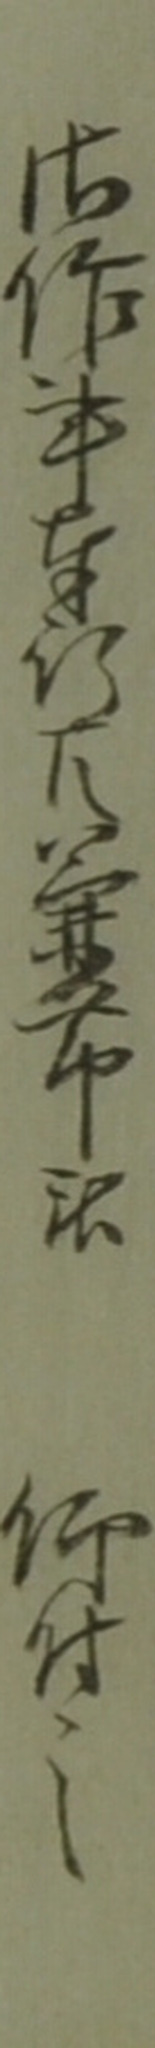御作事奉行共兼帯被仰付之

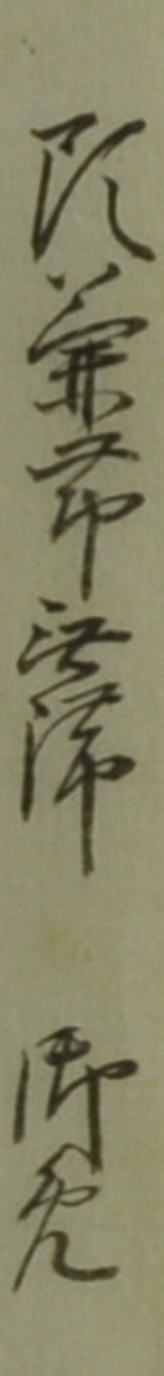頭兼帯無滞御免
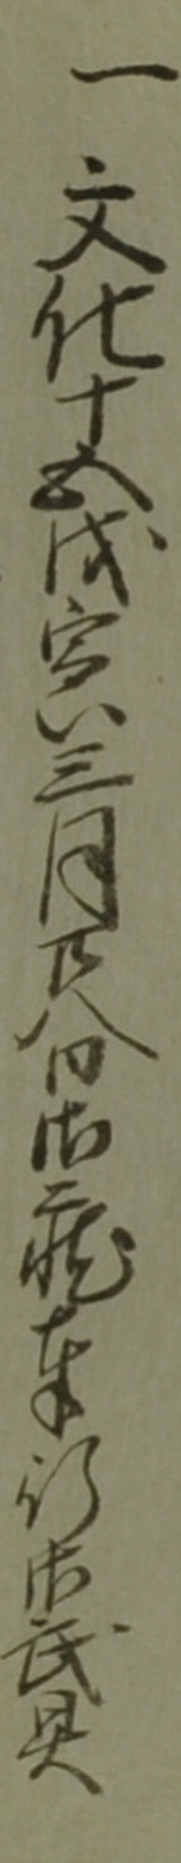一文化十五戊寅三月廿八日御蔵奉行御武具
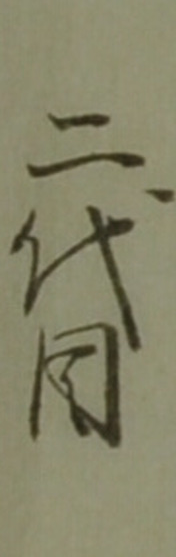二代目
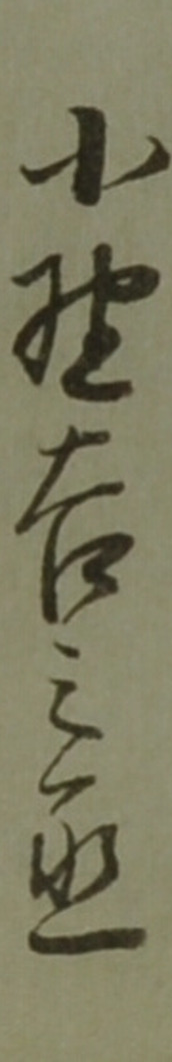小野吉之丞
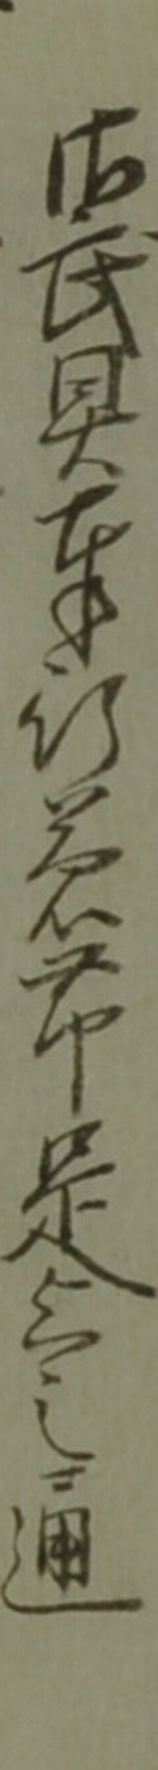御武具奉行兼帯是迄之通
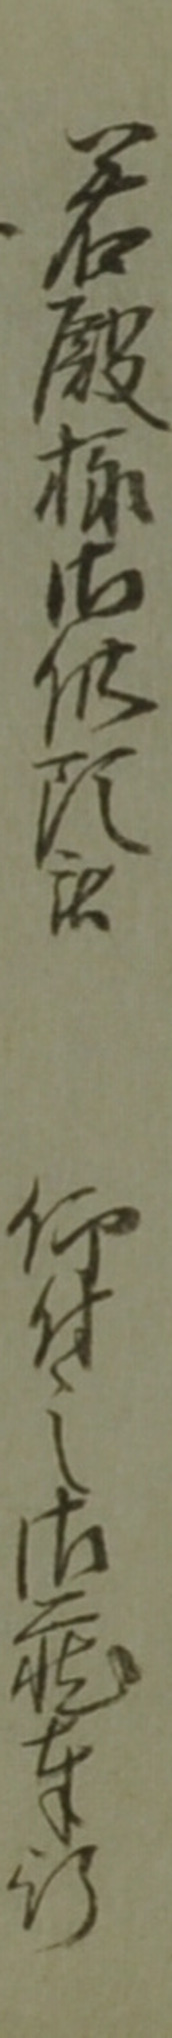若殿様御供頭被仰付之御蔵奉行
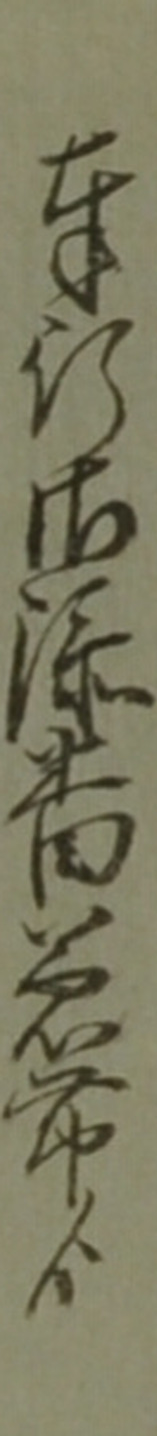奉行御添番兼帯ゟ
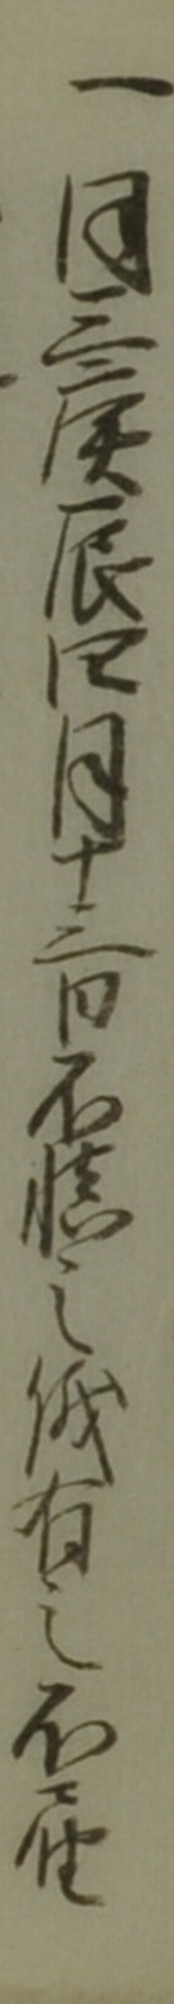一同三庚辰四月十三日不慎之儀有之不届
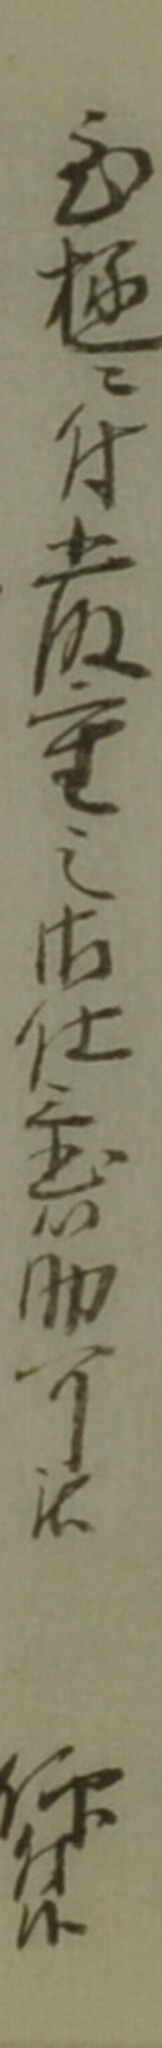至極ニ付厳重之御仕置筋可被仰付候
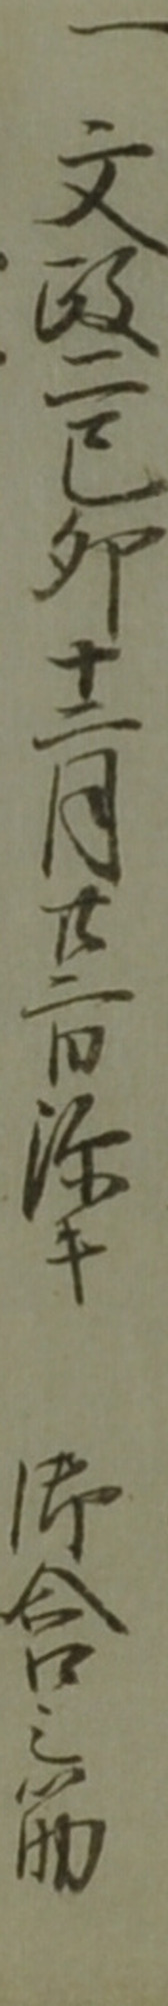一文政二己卯十二月廿二日深キ御含之筋
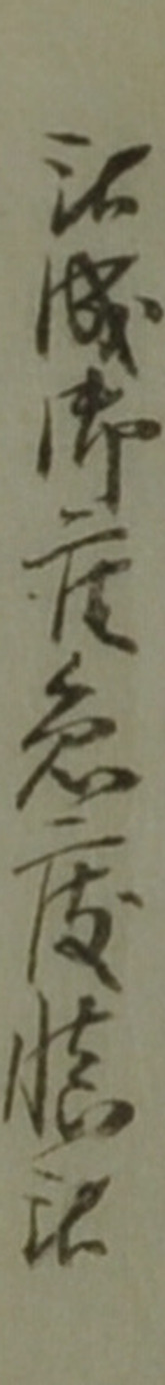被成御座急度慎被仰付
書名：諸御役代々録（六）
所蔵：伊那市立高遠町図書館・合同会社AMANE
